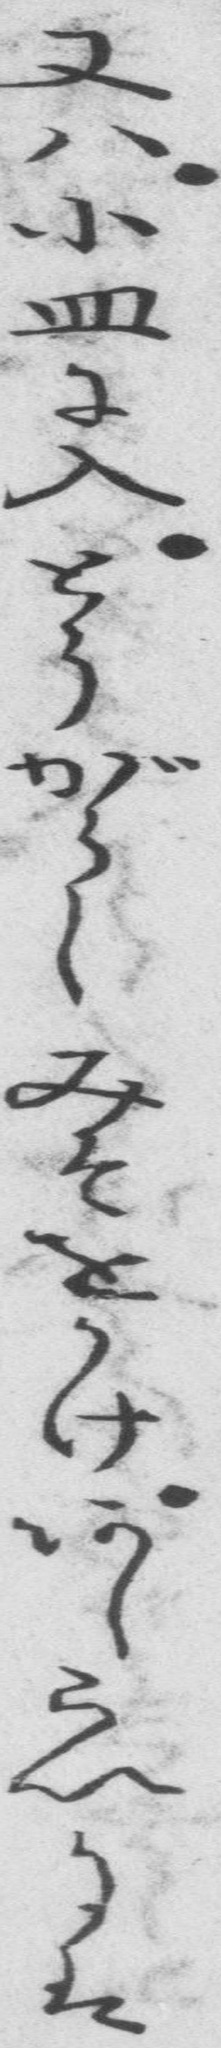又は。小皿に入。とうがらしみそをかけ。あしらいには
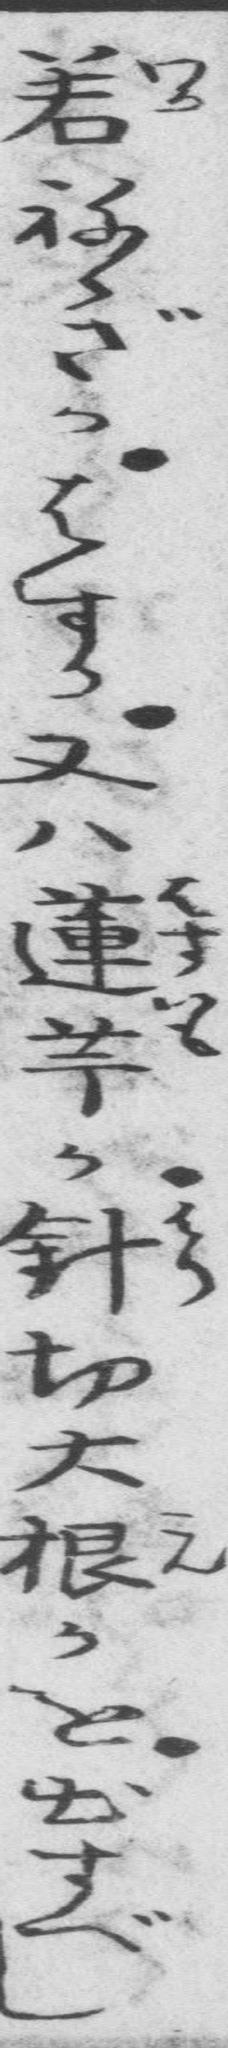若ねぎか。はすか。又は蓮芋か。針切大根かを。出すべし
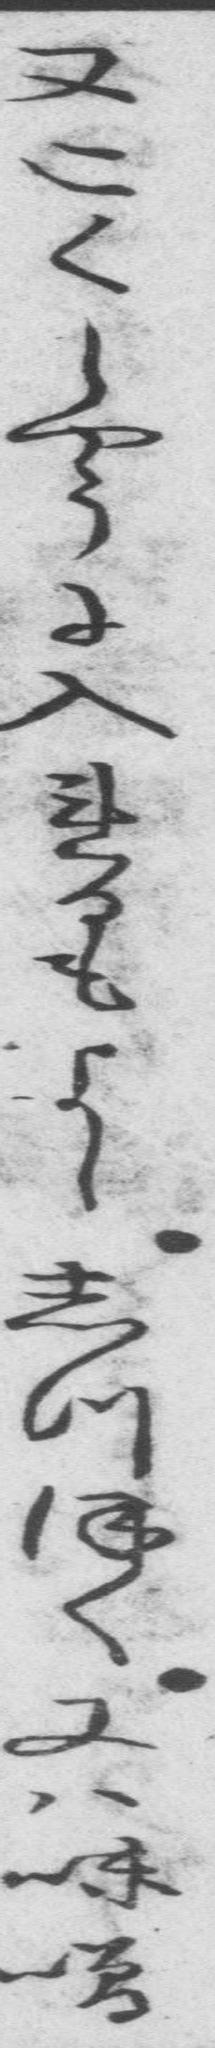又こくしやうに入れるもよし。しつほく。又は味噌
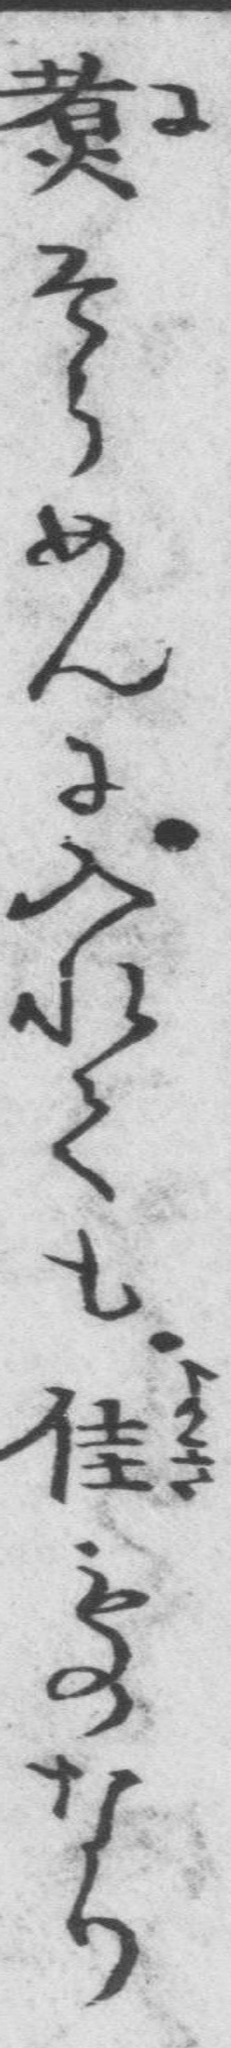煮そうめんに。入れても。佳ものなり
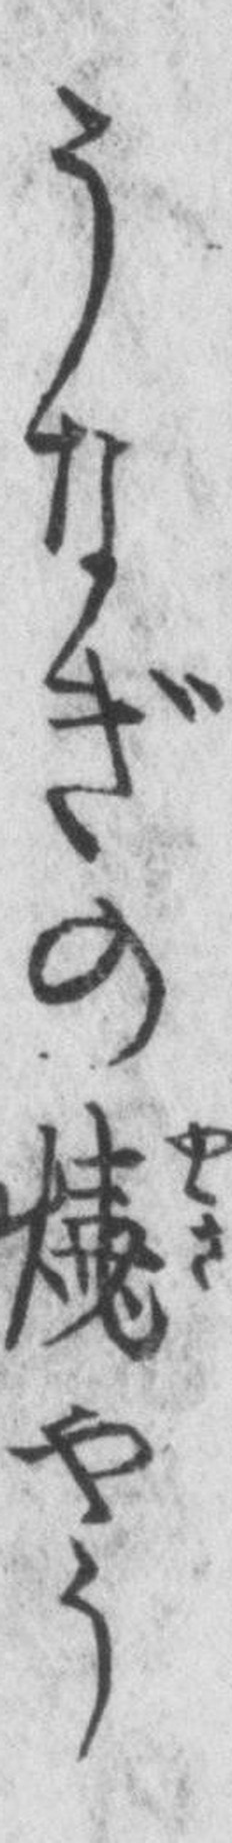うなぎの焼やう
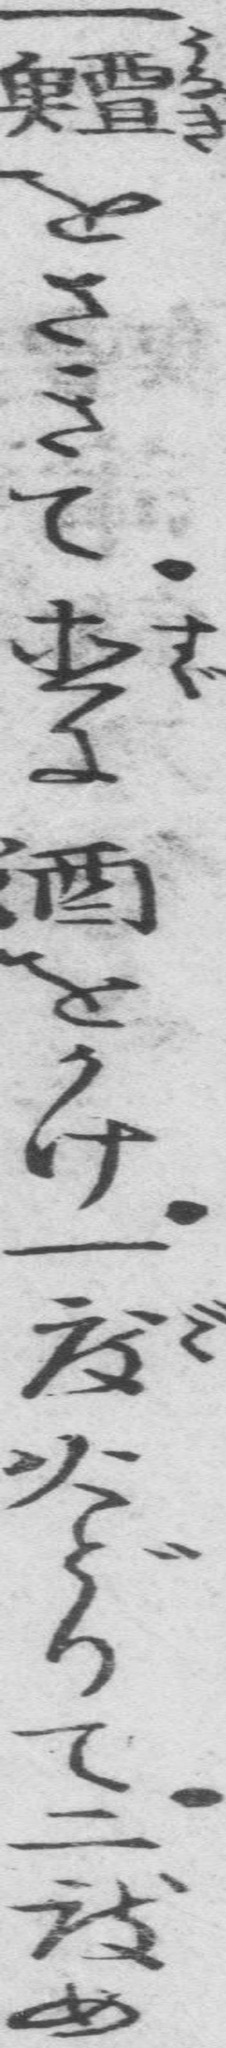一鱣をさきて。直に酒をかけ。一度火どりて。二度め
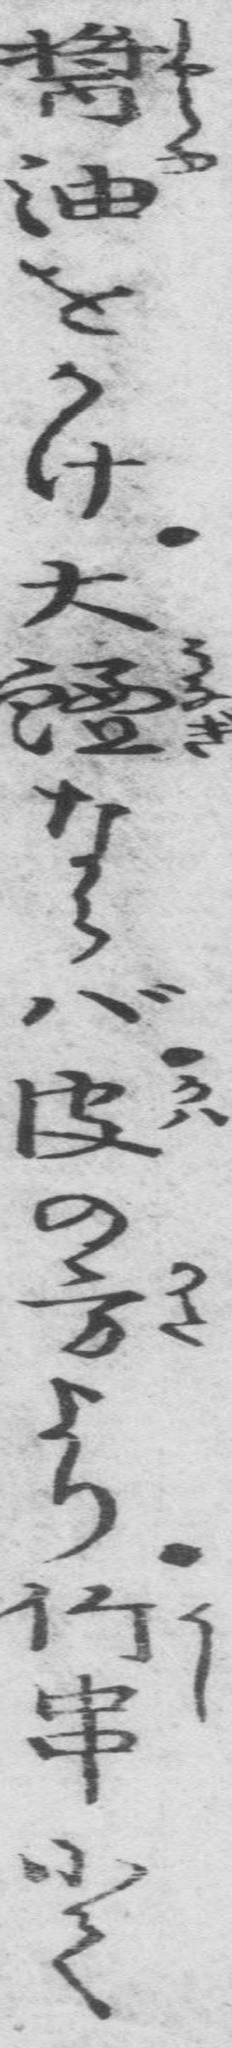醤油をかけ。大鱣ならば。皮の方より。竹串にて
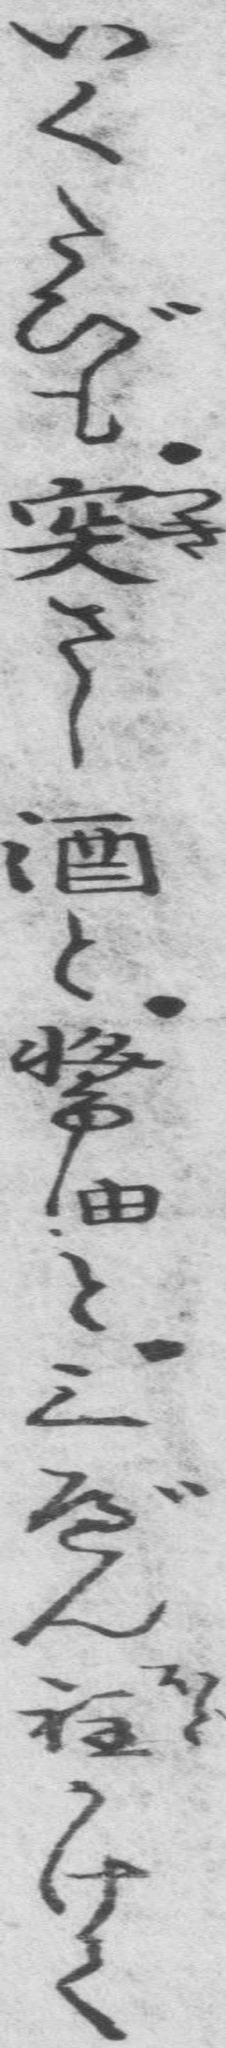いくたびも。突さし酒と。醤油と。三べん程かけて

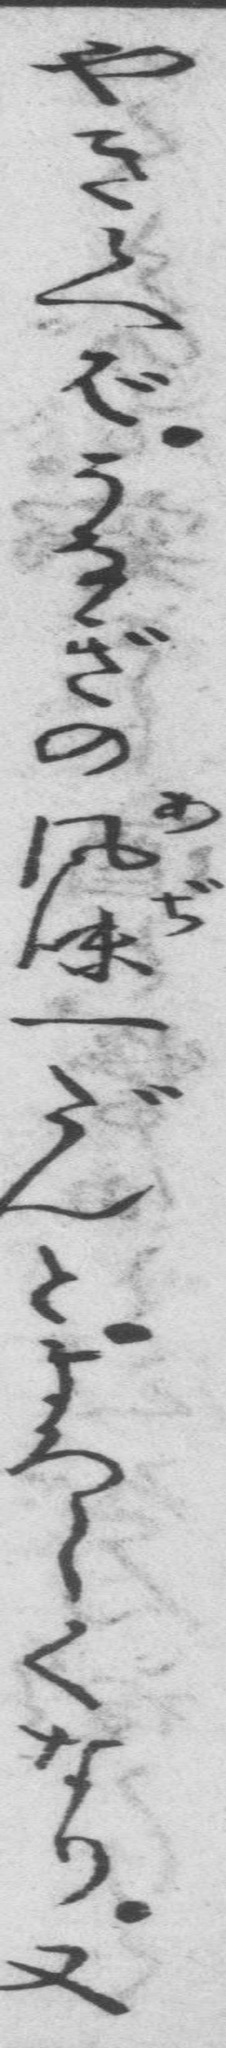やき候へば。うなぎの風味一だんと。よろしくなり。又
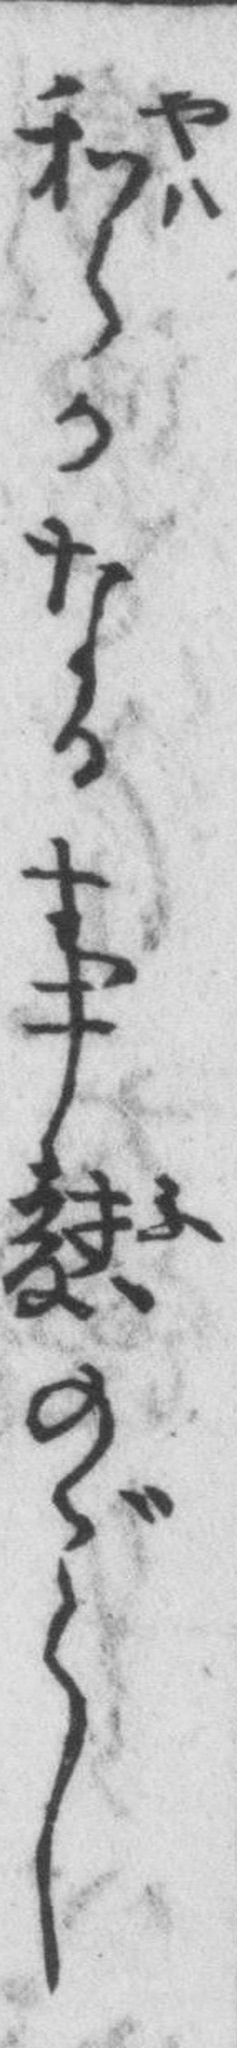和らかなる事麩のごとし
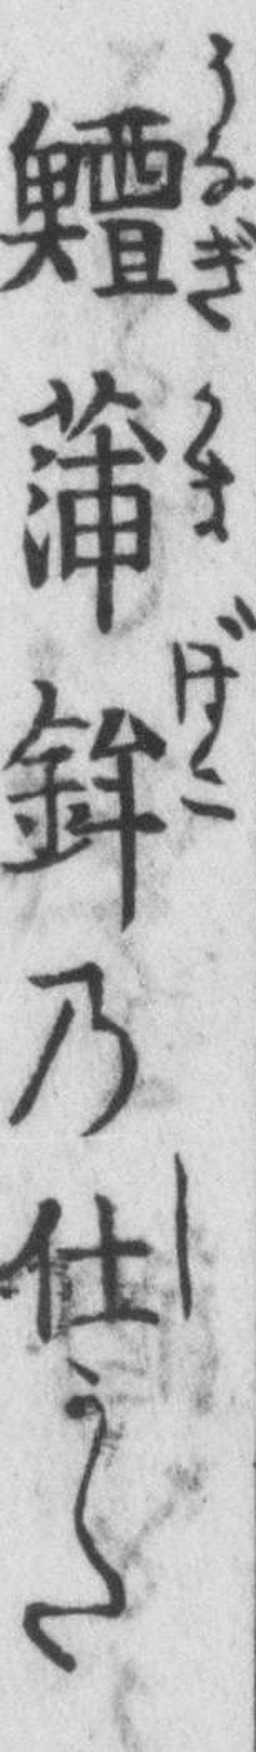鱣蒲鉾の仕かた
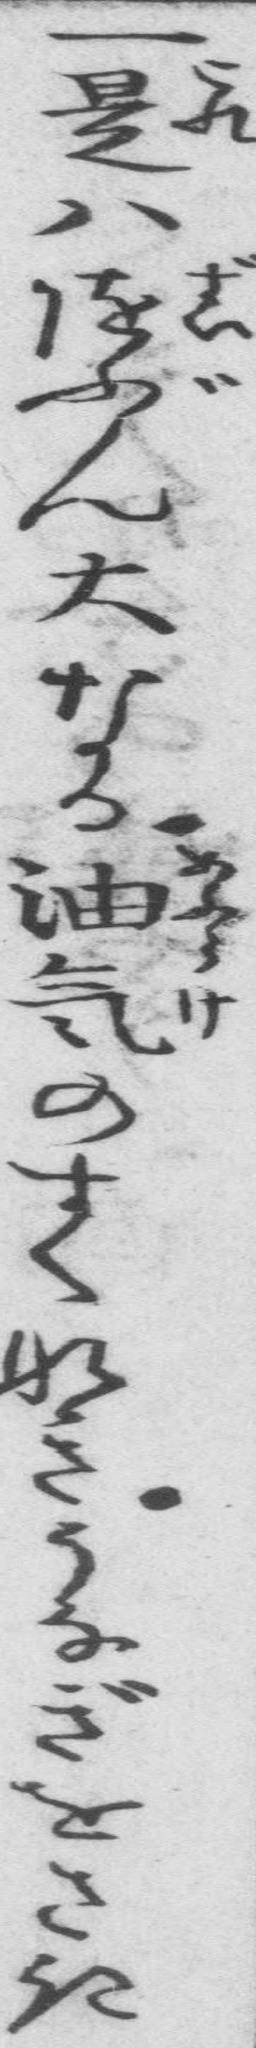一是は随ぶん大なる。油気のすくなき。うなぎをさき
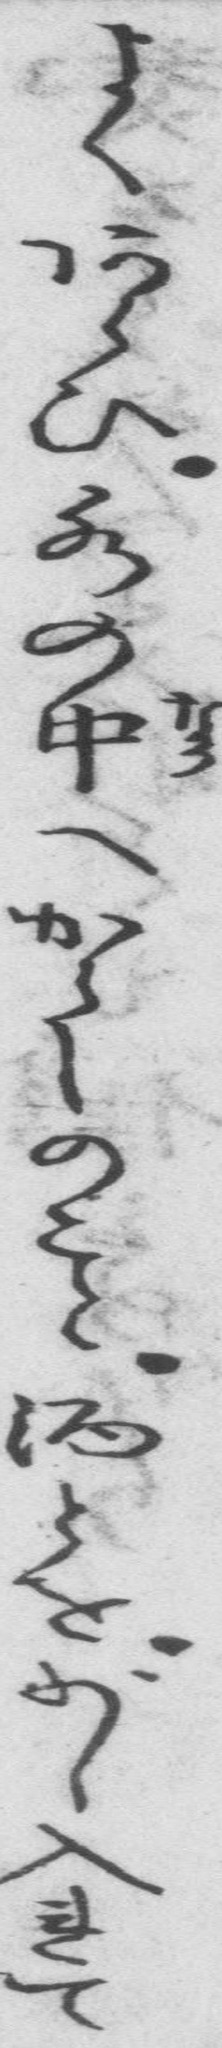よくあらひ。水の中へからしのこと。酒とを。少し入れて
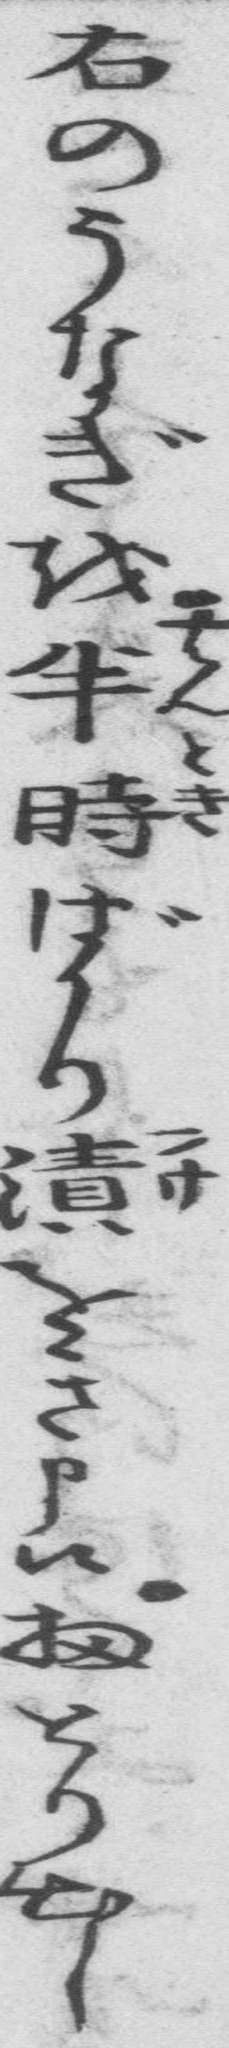右のうなぎを。半時ばかり漬をき申候。扨とり出し
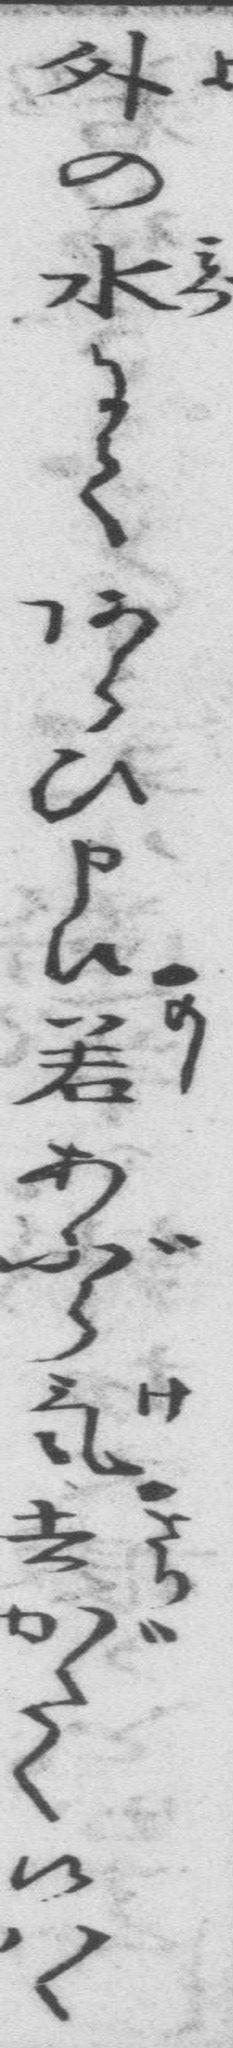外の水にてあらひ申候。若あぶら気。去がたく候はゝ
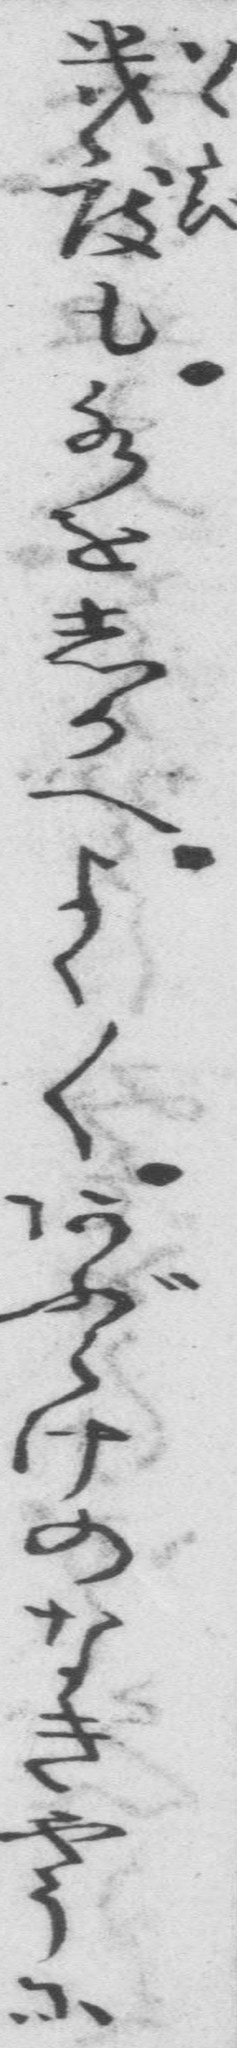幾度も。水をしかへ。よく〳〵。あぶらけのなきやうに
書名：萬寳料理秘密箱
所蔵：大阪府立大学学術情報センター 国文学研究資料館
